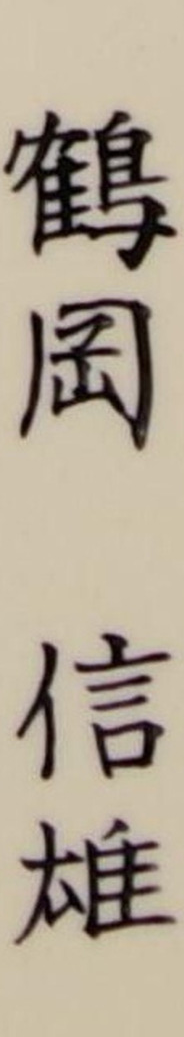鶴岡信雄
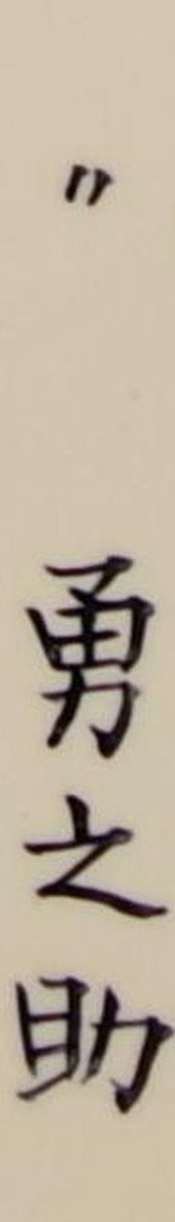勇之助
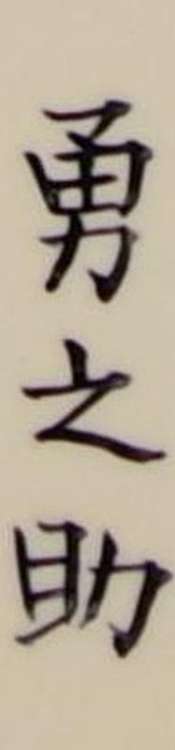勇之助
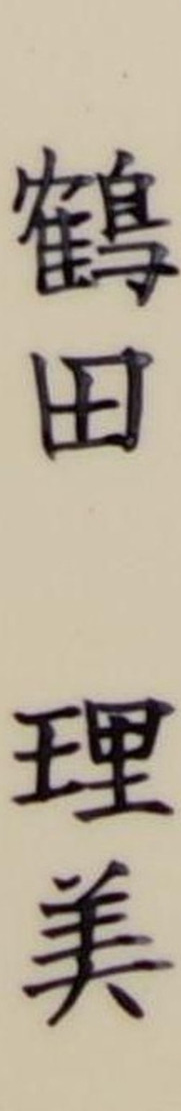鶴田理美
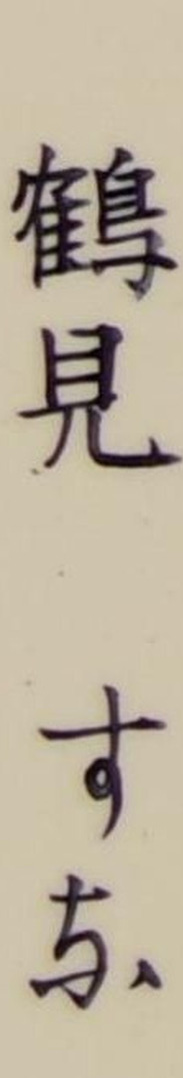鶴見すな
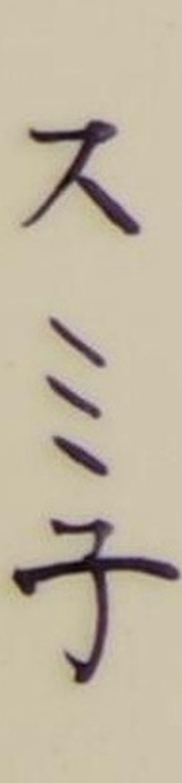スミ子

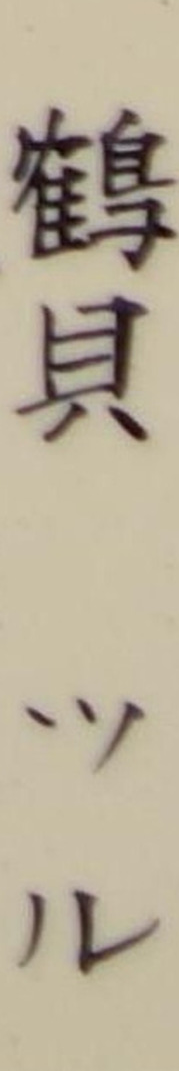鶴貝ツル
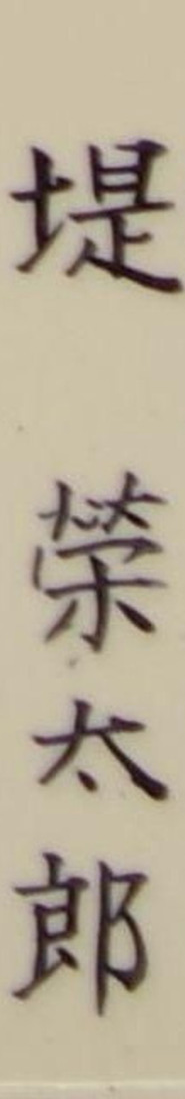堤栄太郎
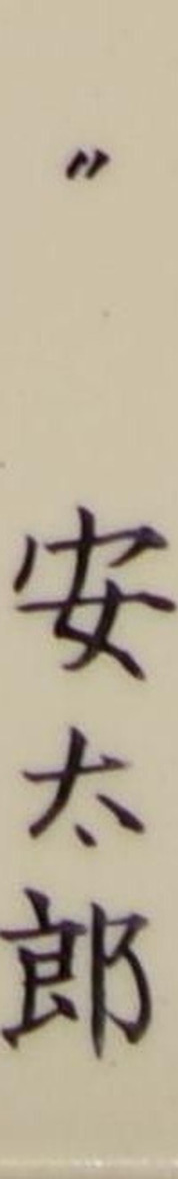安太郎
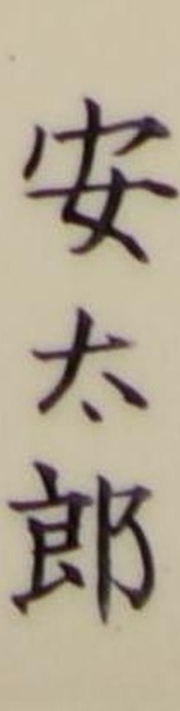安太郎
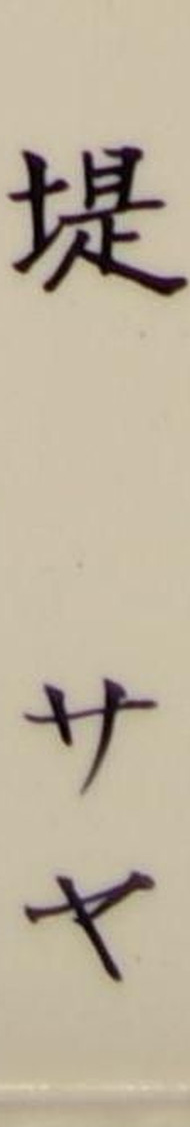堤サヤ
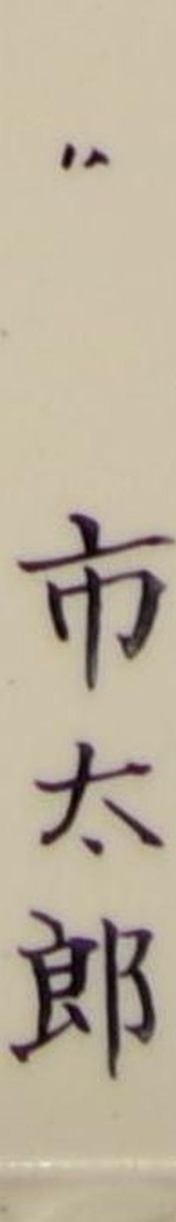市太郎
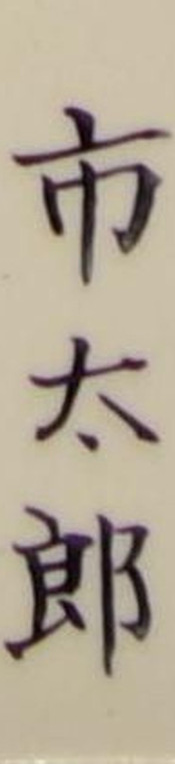市太郎
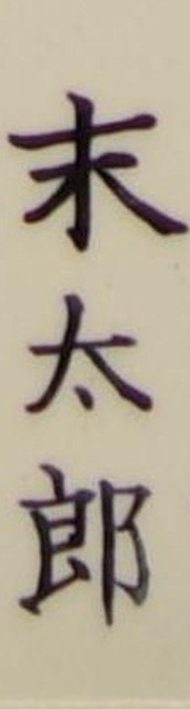末太郎
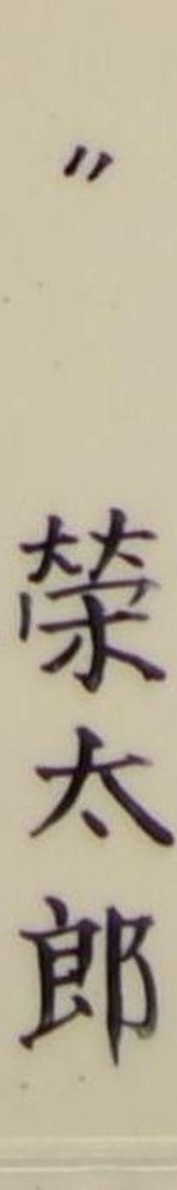榮太郎
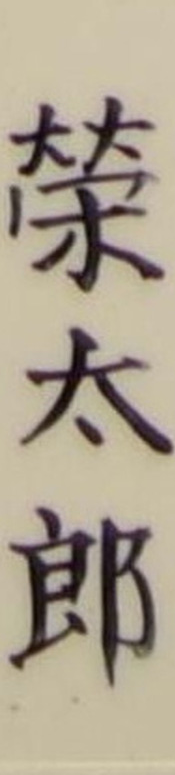榮太郎
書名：E~L
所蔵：高野山金剛峯寺
